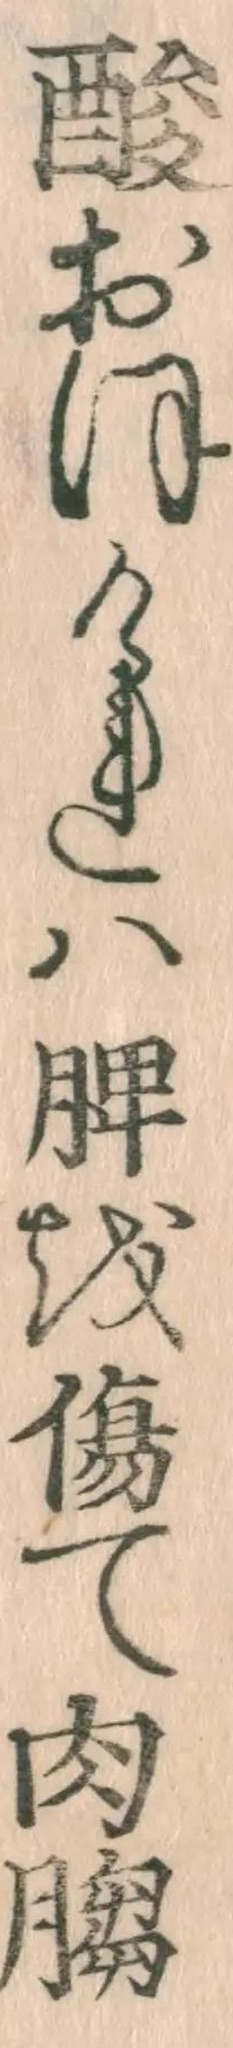酸おほけれは脾を傷て肉䐢
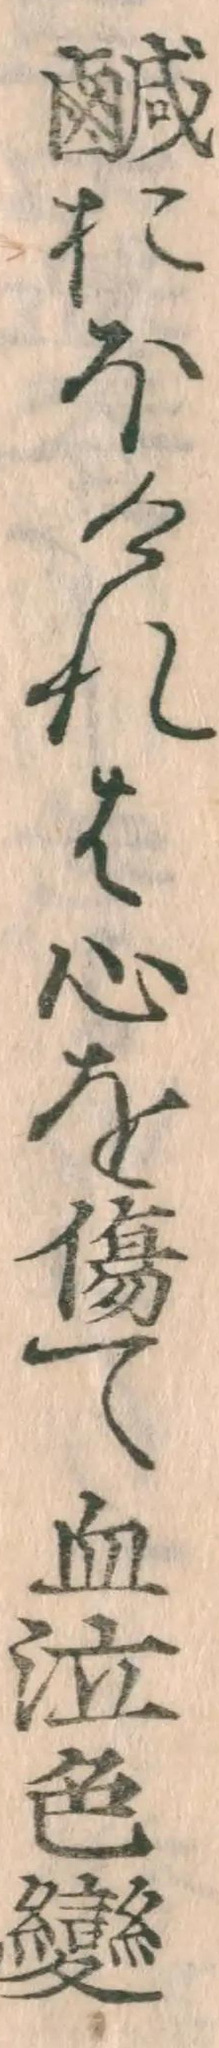鹹おほけれは心を傷て血泣色変
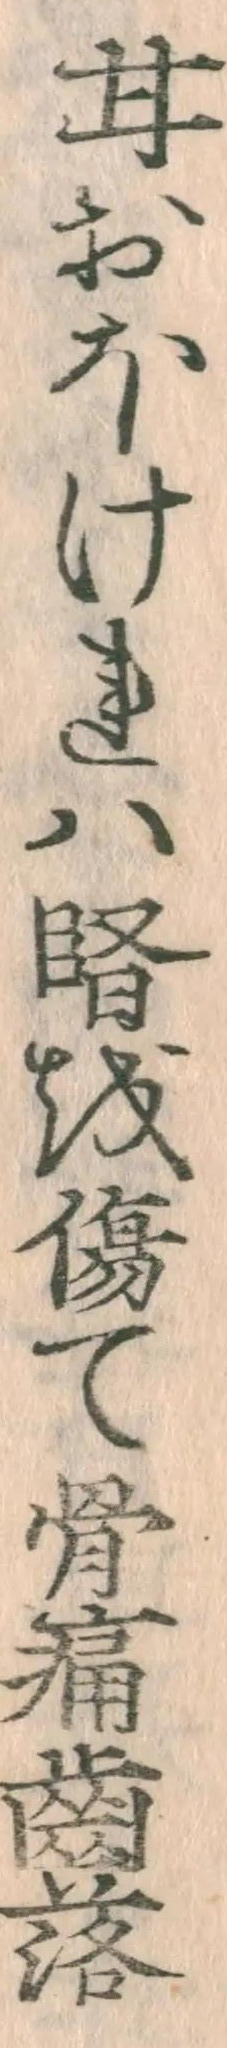甘おほけれは腎を傷て骨痛歯落
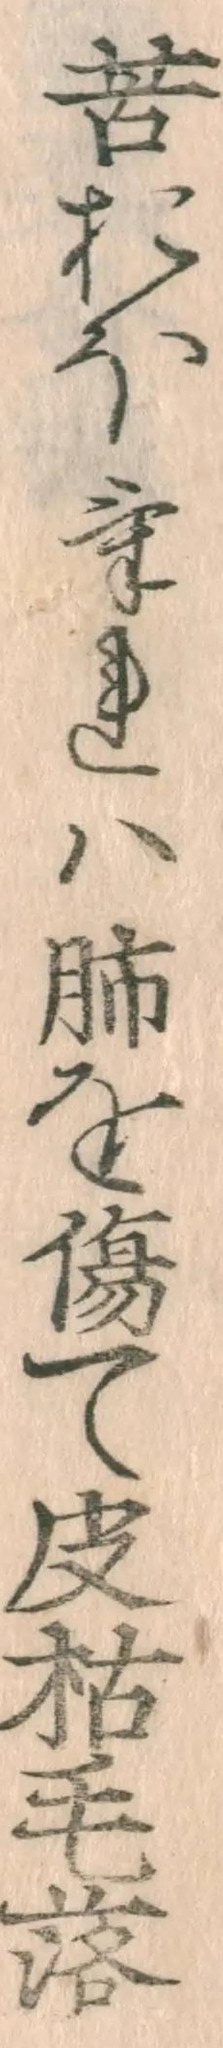苦おほけれは肺を傷て皮枯毛落
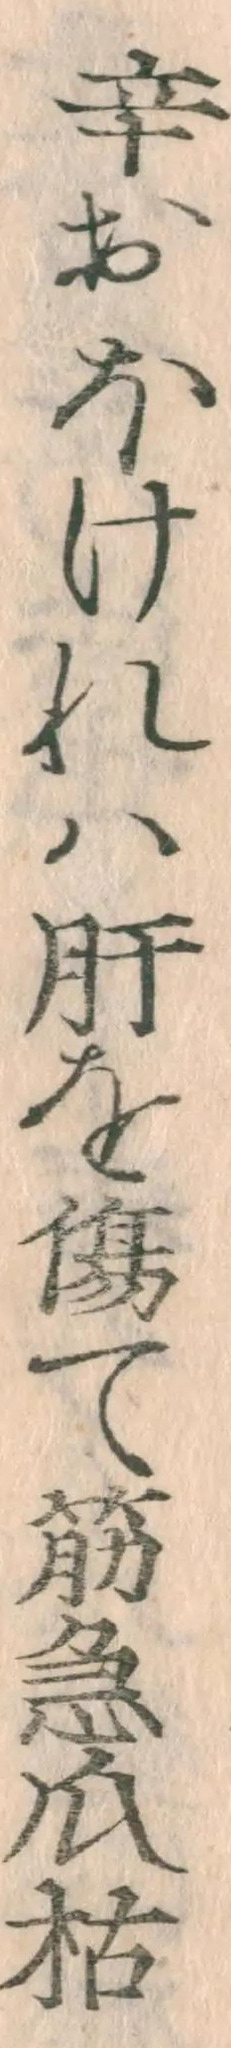辛おほけれは肝を傷て筋急爪枯
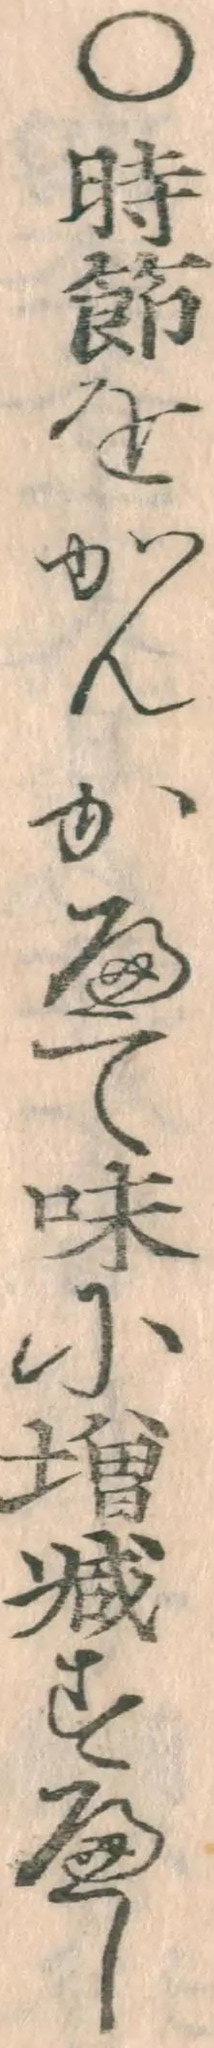〇時節をかんかへて味に増減すへし
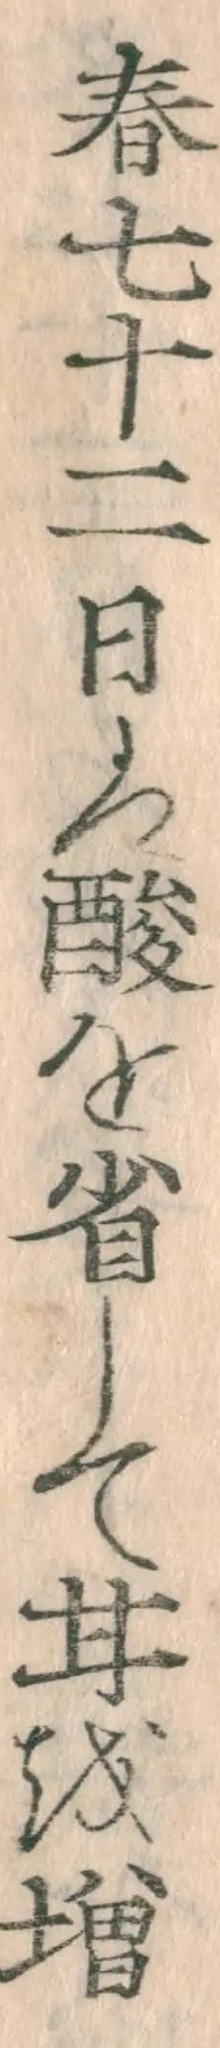春七十二日は酸を省して甘を増
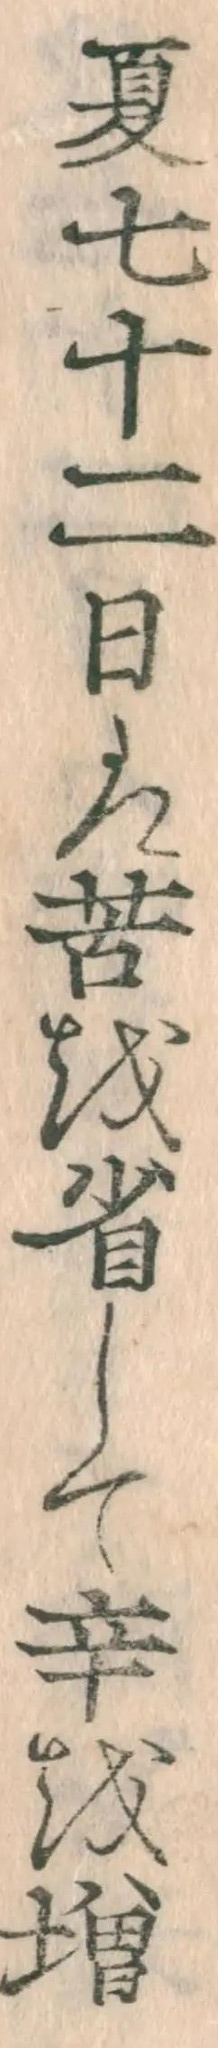夏七十二日は苦を省して辛を増

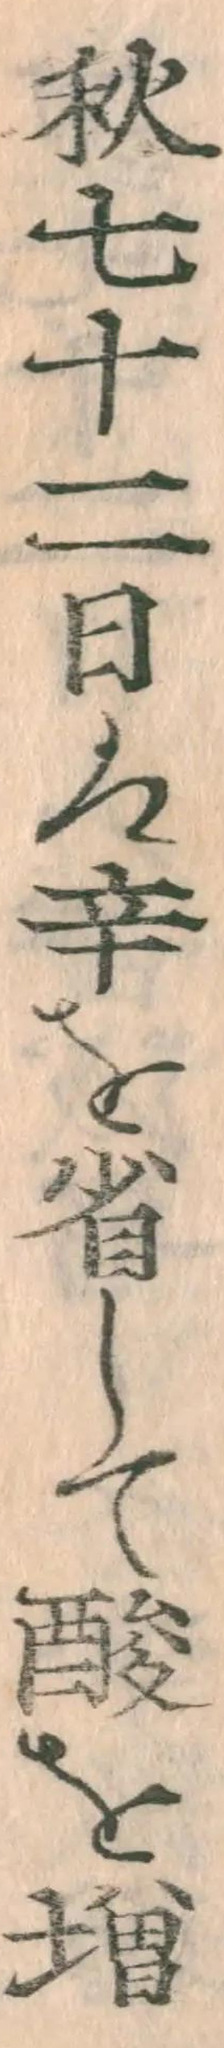秋七十二日は辛を省して酸を増
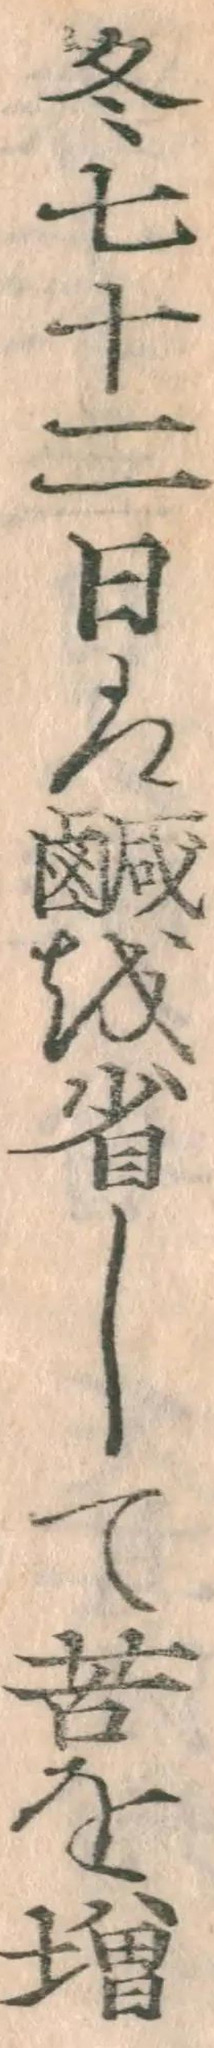冬七十二日は鹹を省して苦を増
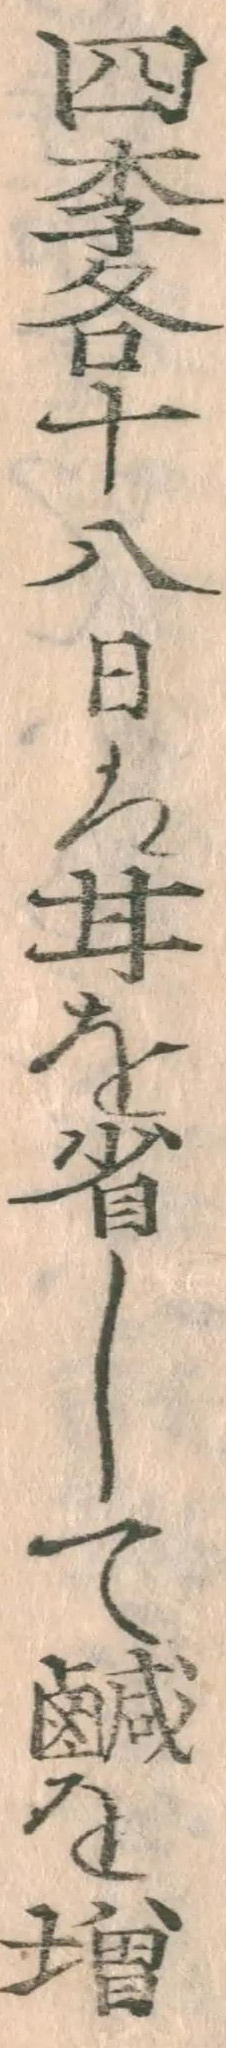四李各十八日は甘を省して鹹を増
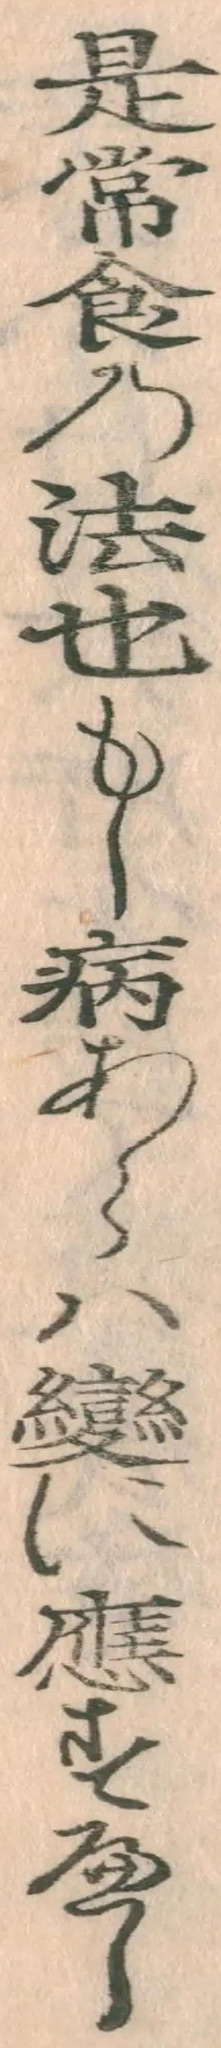是常食の法也もし病あらは変に応すへし
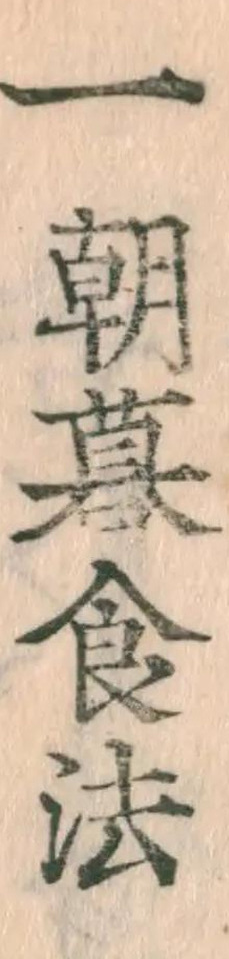一朝暮食法
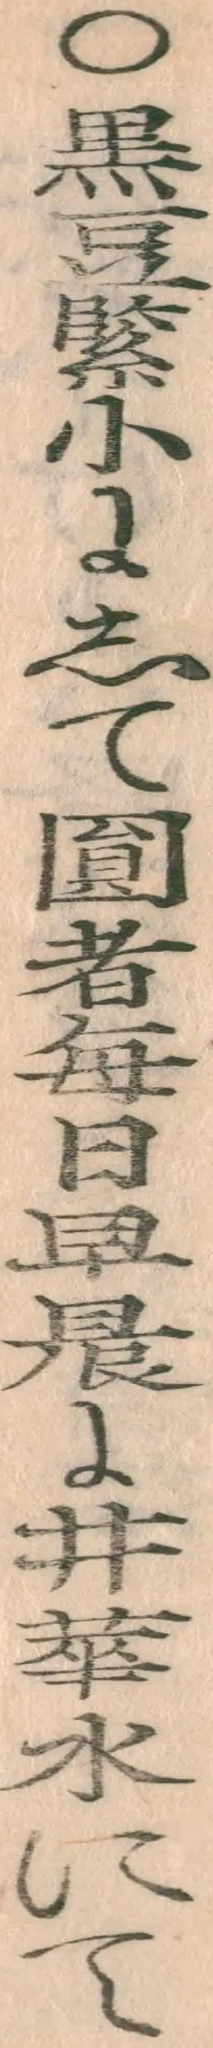〇黒豆緊小にして円者毎日早晨に井華水にて
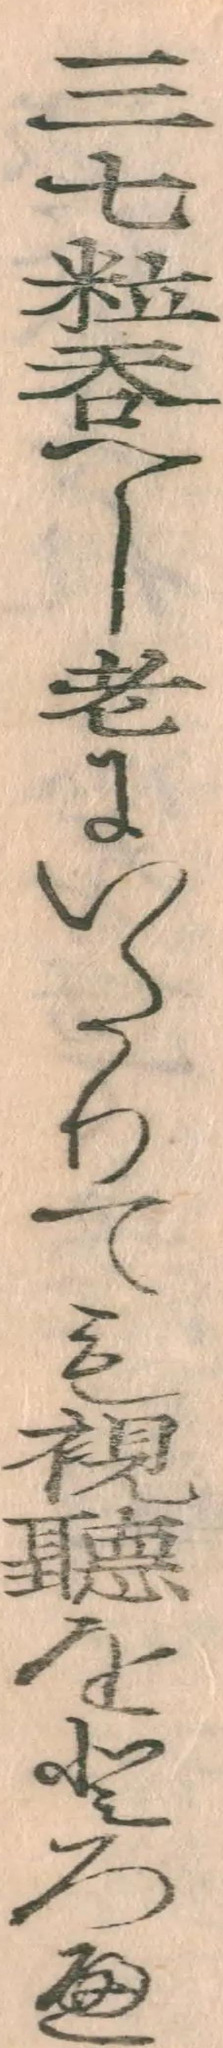三七粒呑へし老にいたりても視聴をとろへ
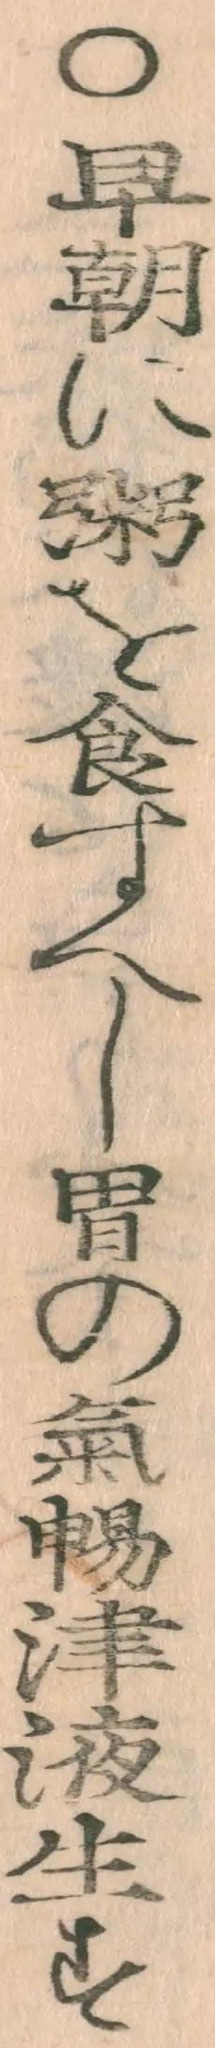〇早朝に粥を食すへし胃の気暢津液生す
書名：延壽撮要
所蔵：国立国会図書館 National Diet Library, JAPAN
